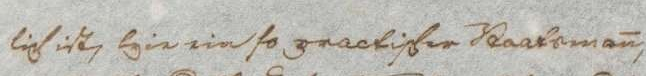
lich ist, wie ein so practischer Staatsmann,
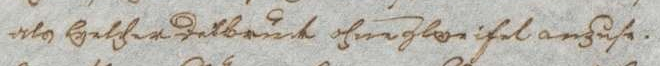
als welcher Delbrück ohne Zweifel anzuse-
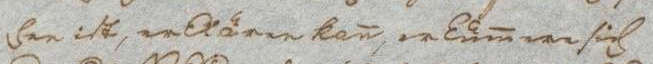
hen ist, erklären kann, er kümmere sich
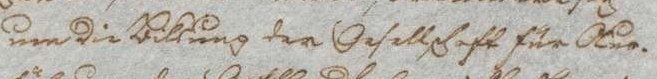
um die Bildung der Gesellschaft für Aus-
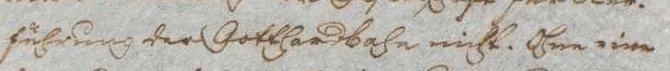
führung der Gotthardbahn nicht. Ohne eine
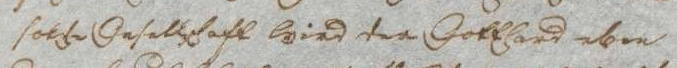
solche Gesellschaft wird der Gotthard eben
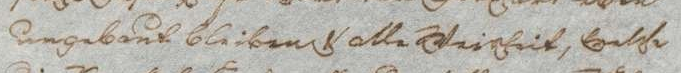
ungebaut bleiben & alle Weisheit, welche
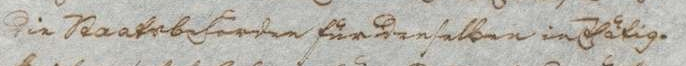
die Staatsbehörden für denselben in Thätig-
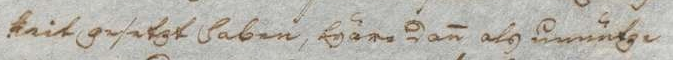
keit gesetzt haben, wäre dann als unnütze
